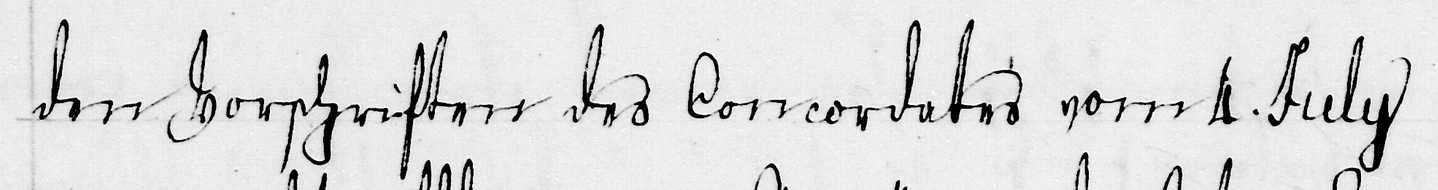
den Vorschriften des Concordates vom 4. July
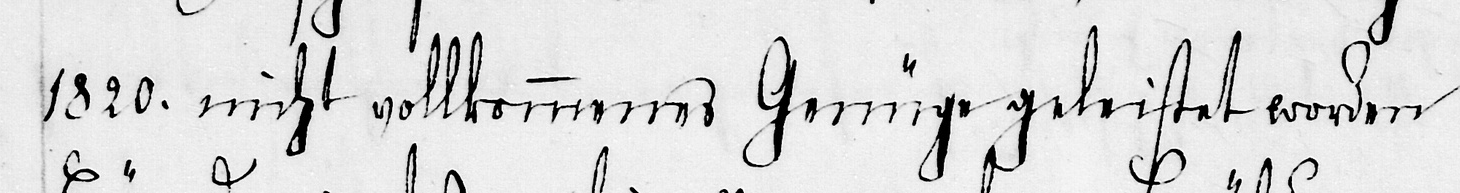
1820. nicht vollkommenes Genüge geleistet worden
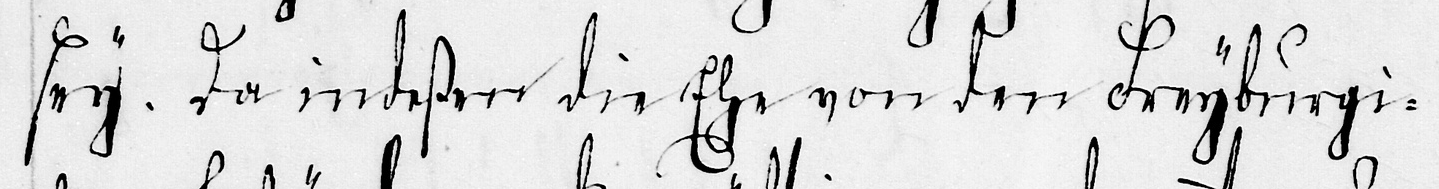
sey. Da indeßen die Ehe von den Freyburgi¬
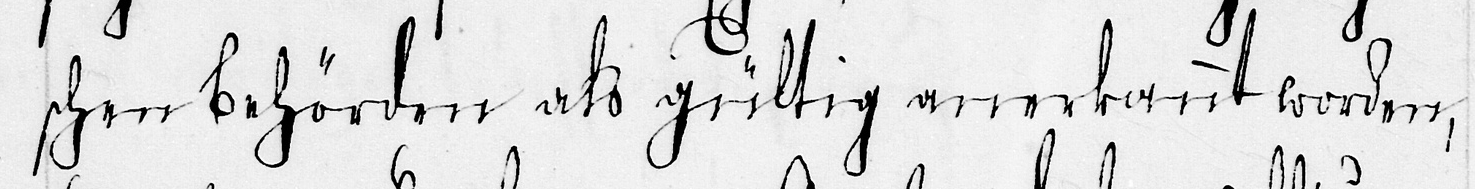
schen Behörden als gültig anerkannt worden,
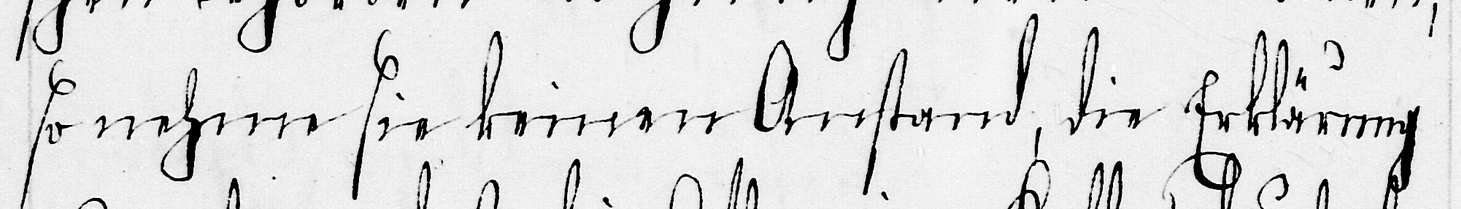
so nehme sie keinen Anstand, die Erklärung
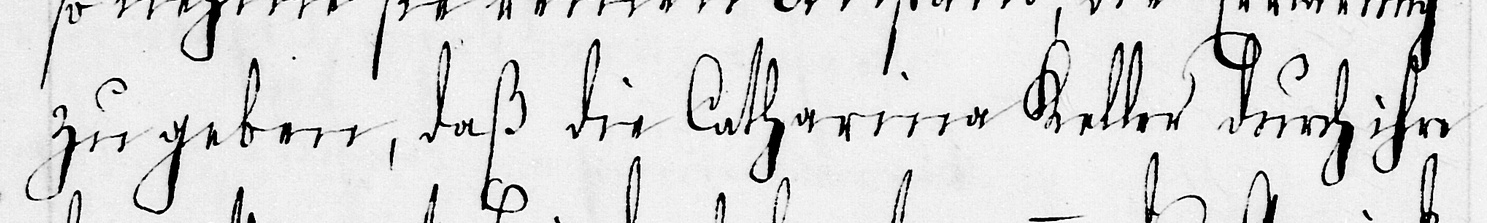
zu geben, daß die Catharina Keller durch ihre
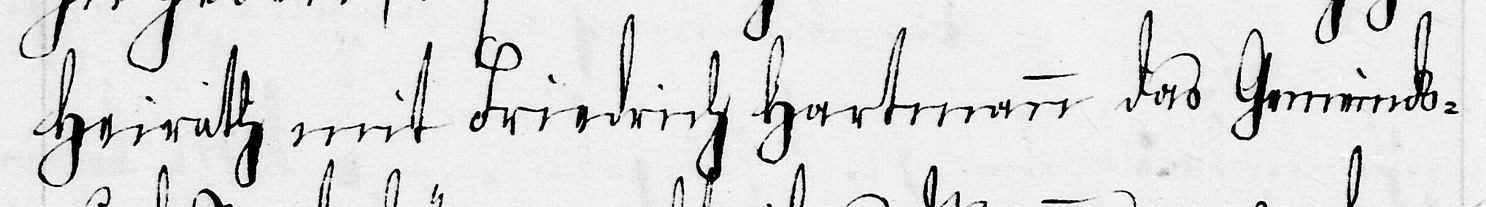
Heirath mit Friedrich Hartmann das Gemeinds-
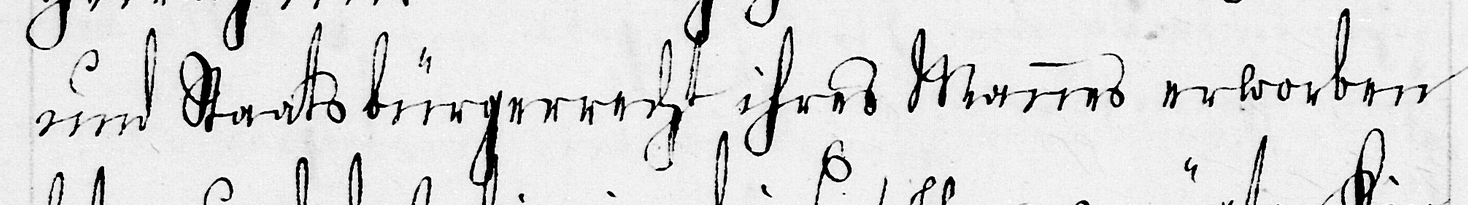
und Staatsbürgerrecht ihres Mannes erworben
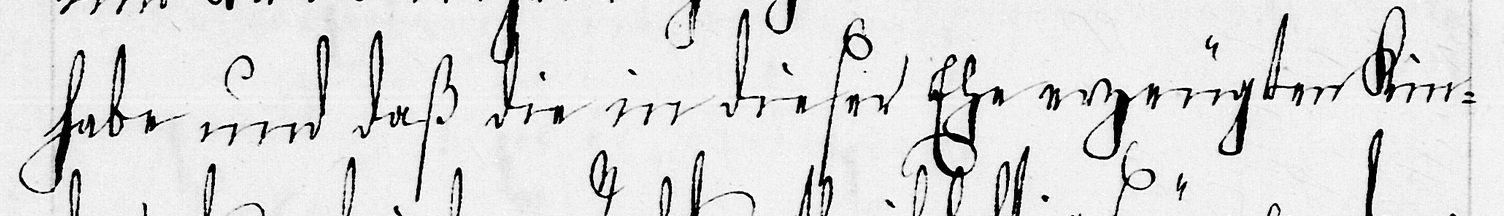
habe und daß die in dieser Ehe erzeugten Kin¬
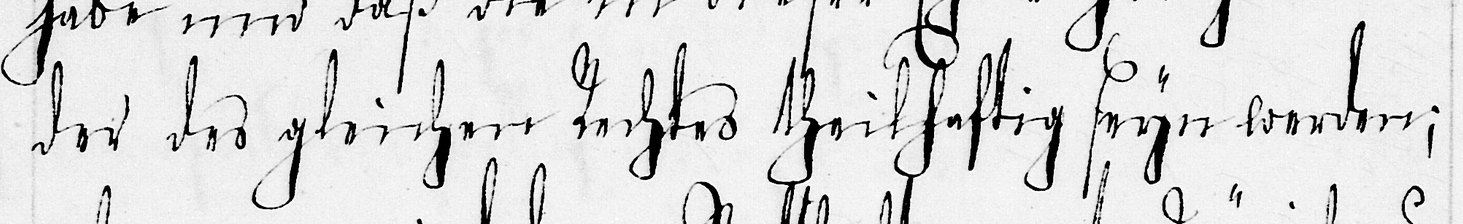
der des gleichen Rechtes theilhaftig seyn werden;
